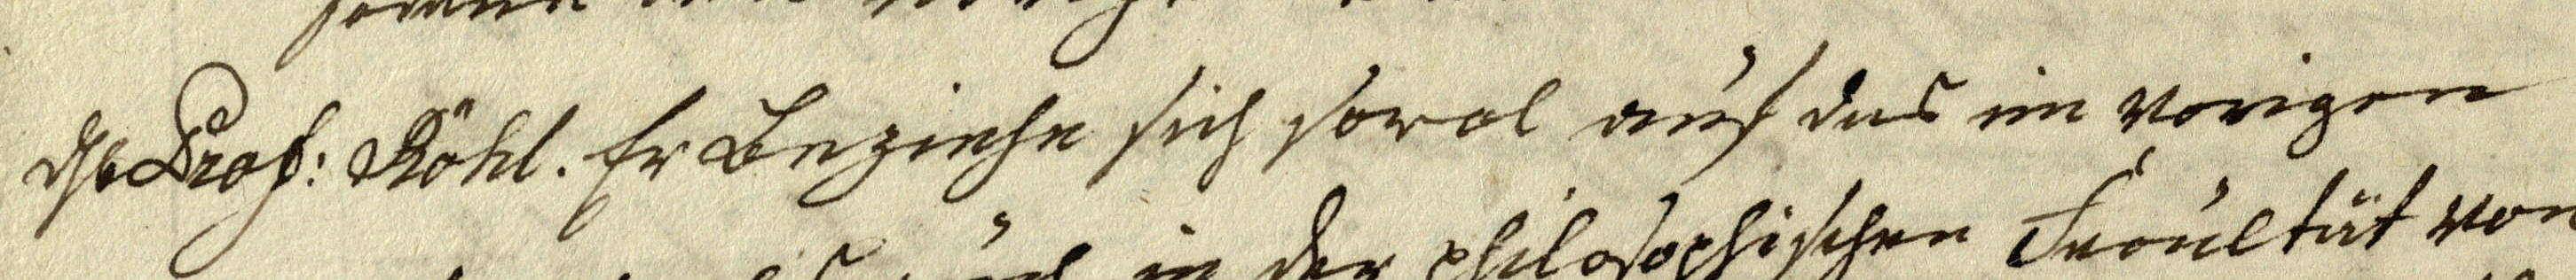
dh Prof. Röhl. Er beziehe sich sowol auf das im vorigen
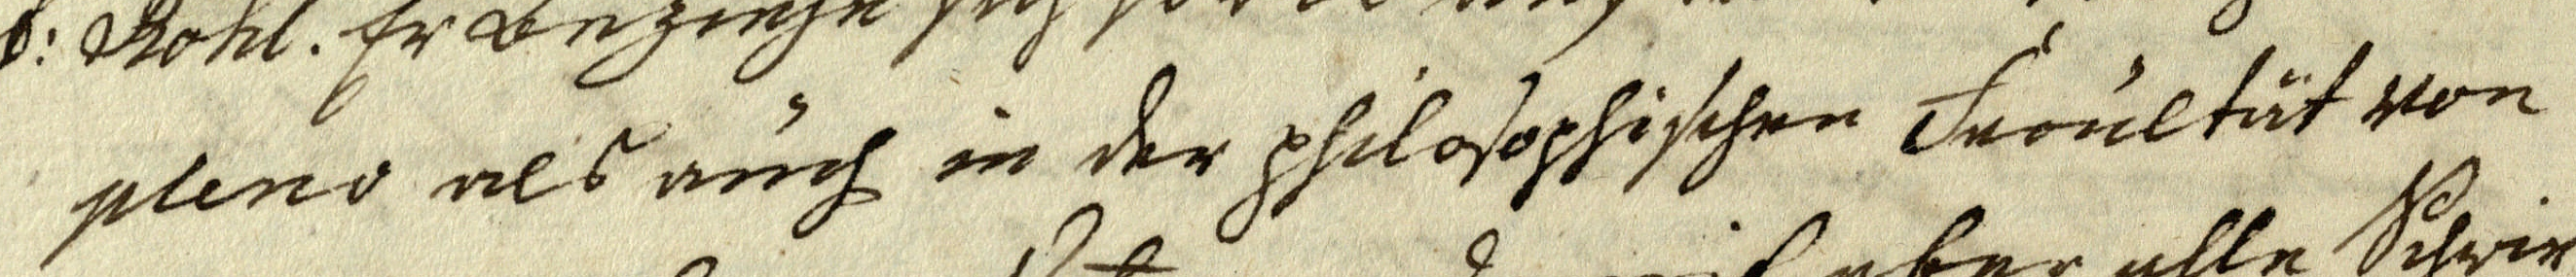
pleno als auch in der philosophischen Facultät von
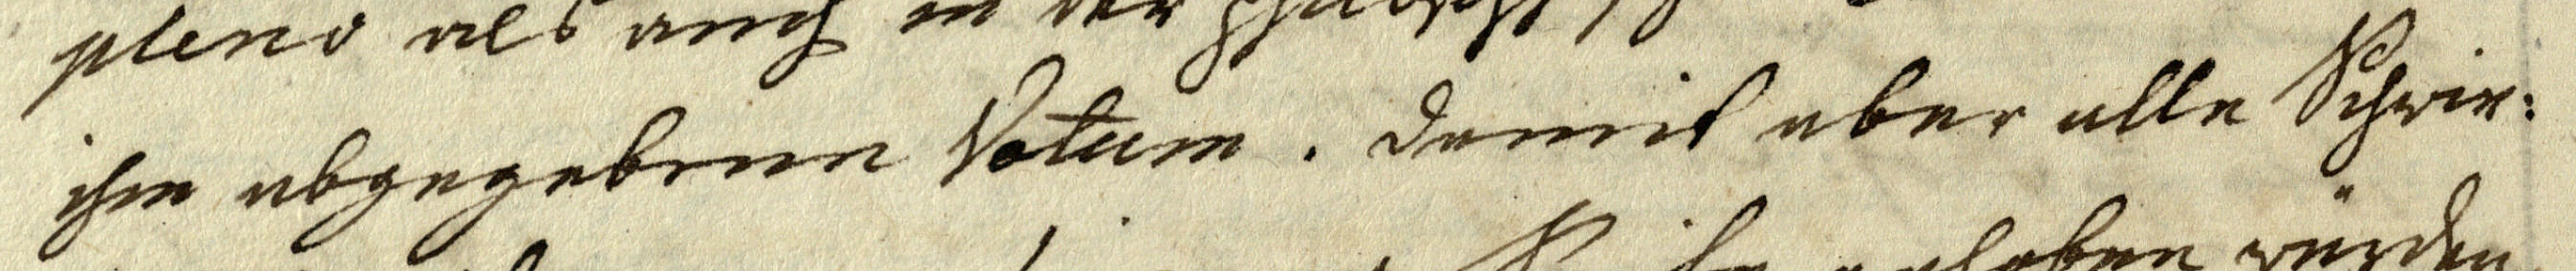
ihm abgegebene Votum. Damit aber alle Schwie¬
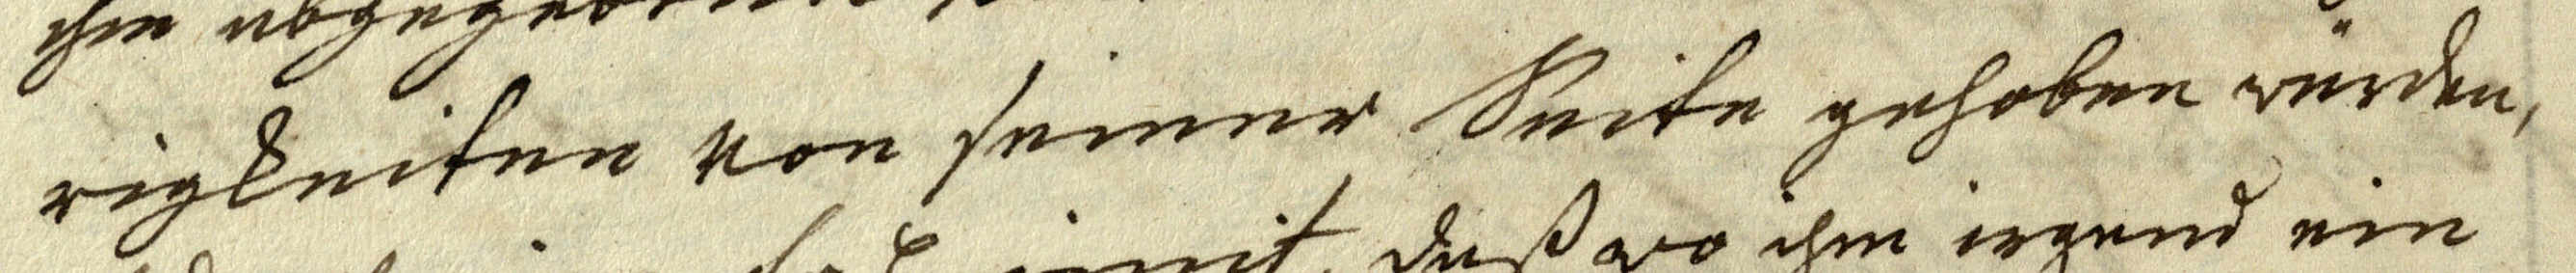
rigkeiten von seiner Seite gehoben würden,
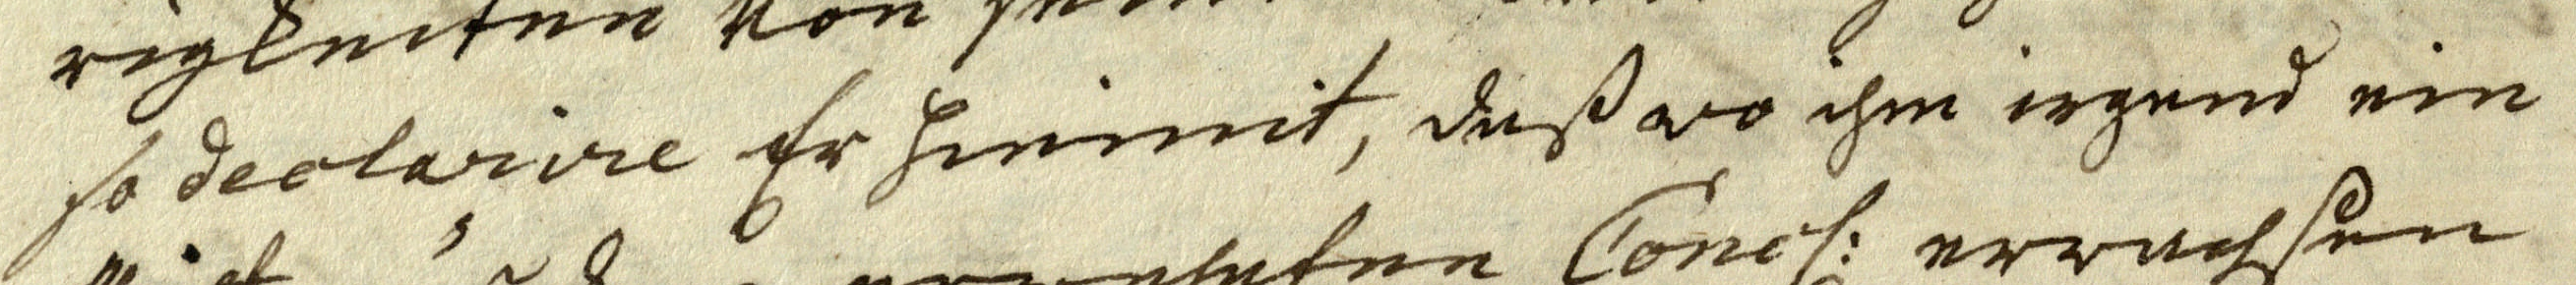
so declarire Er hiemit, daß wo ihm irgend ein
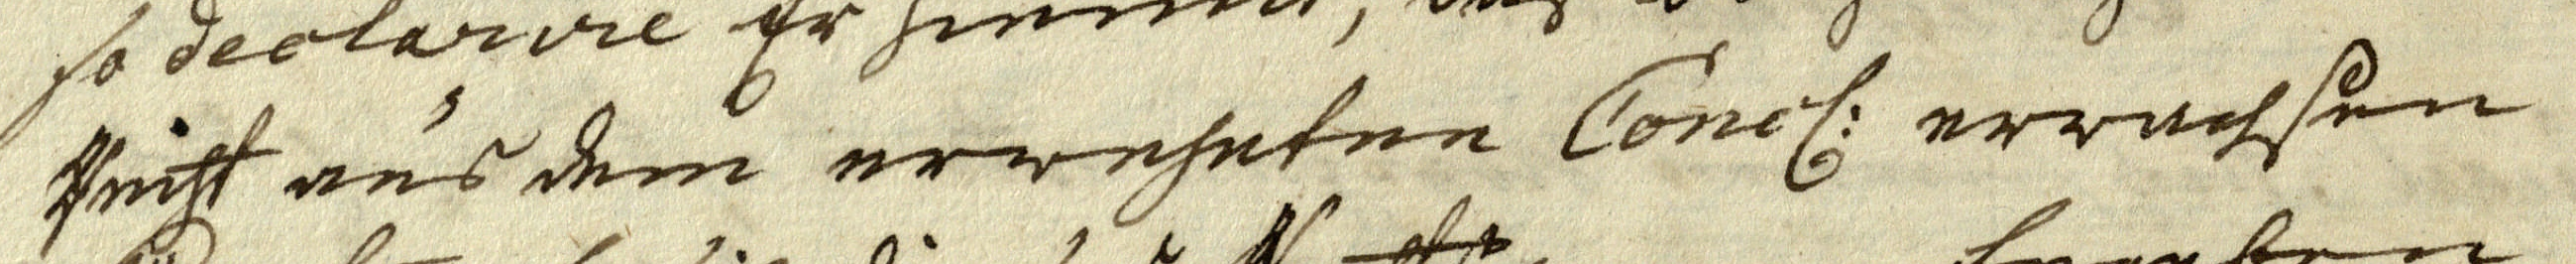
Recht aus dem erwehnten Concl. erwachsen
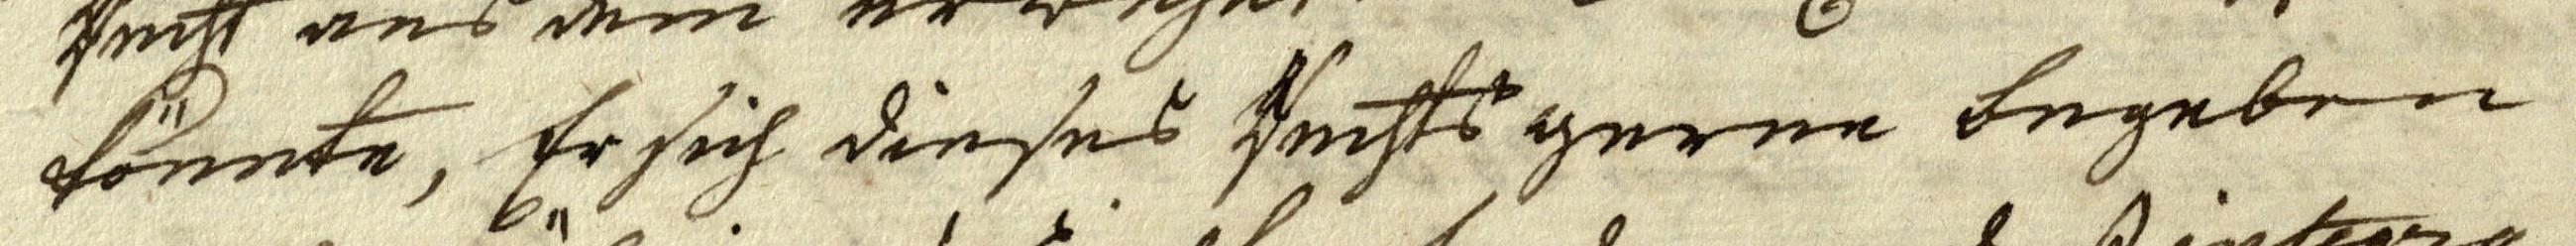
könnte, Er sich dieses Rechts gerne begeben
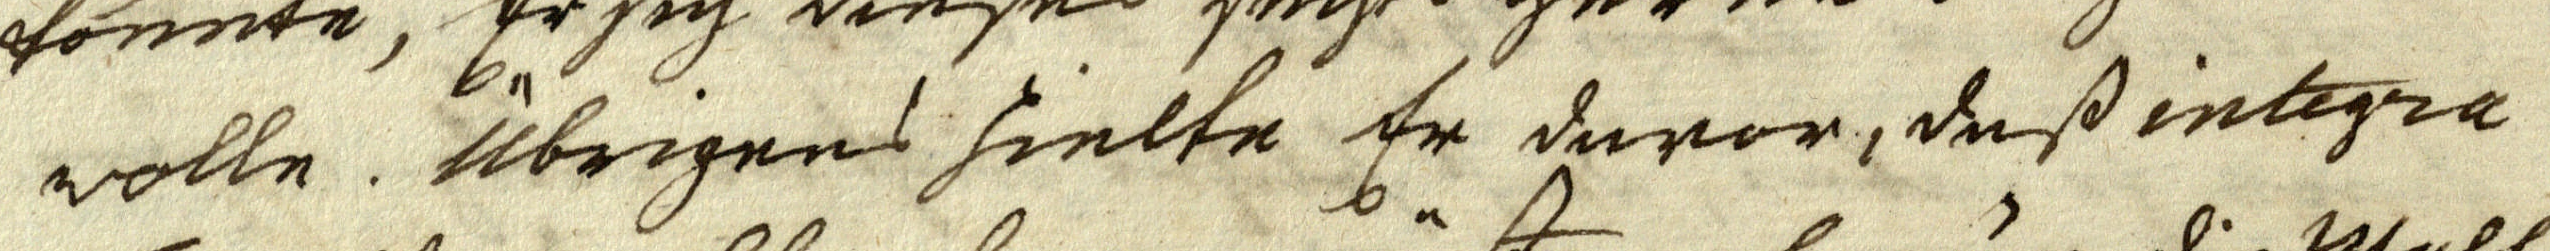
wolle. Übrigens hielte Er davor, daß integra
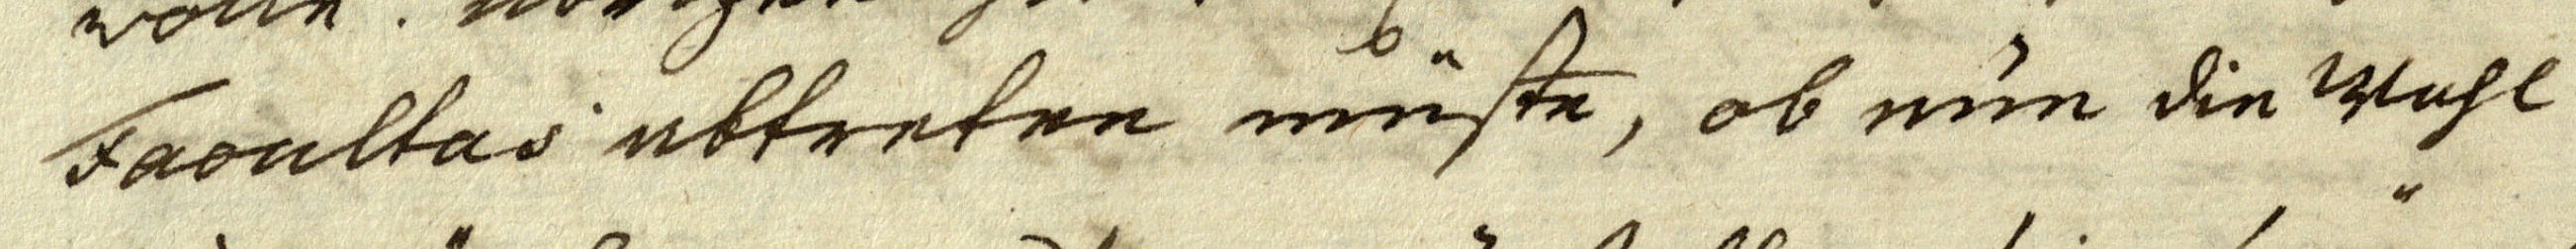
Facultas abtreten müste, ob nun die Wahl
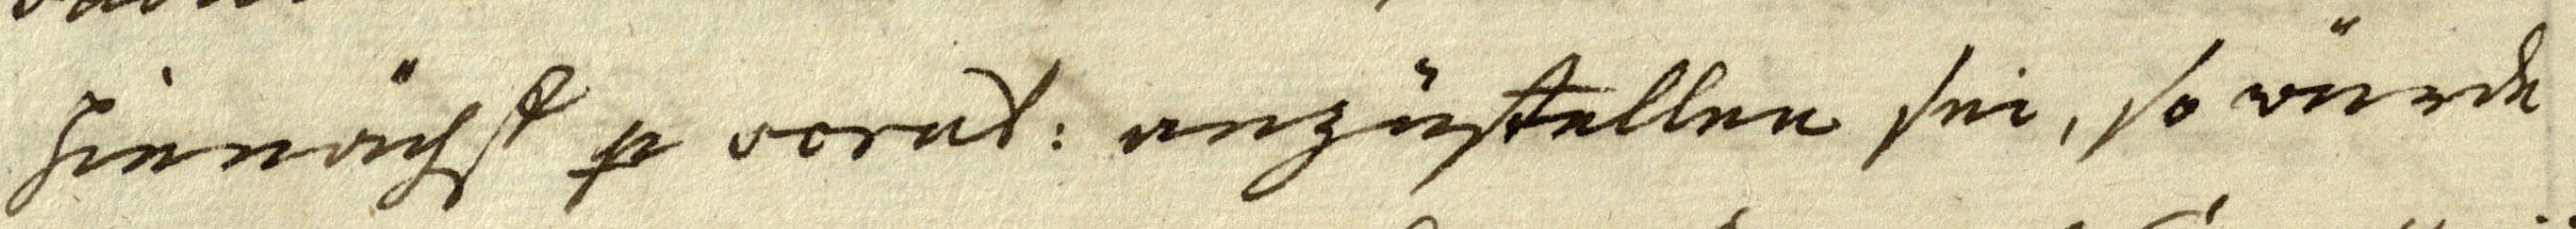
hienechst p scrut. anzustellen sei, so würde
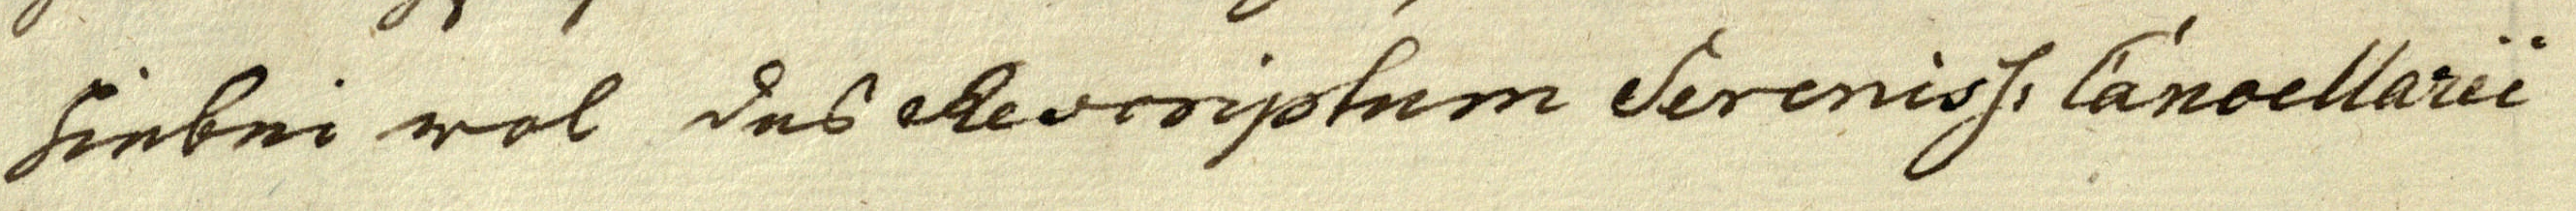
hiebei wol das Rescriptum Sereniss. Cancellarii
